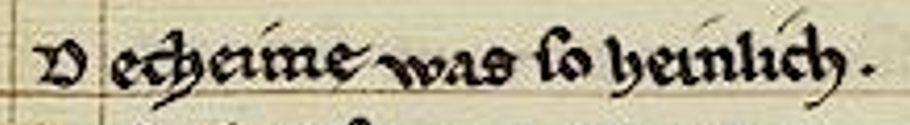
Decheime was ſo heinlich.
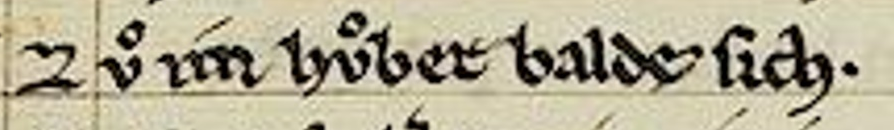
Zv°o im hv°ober balde ſich.
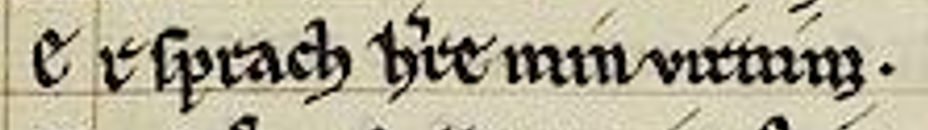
Er ſprach h(er)re min virnim.
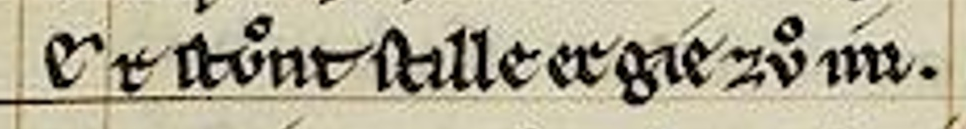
Er ſtv°ont ſtille er gie zv°o im.
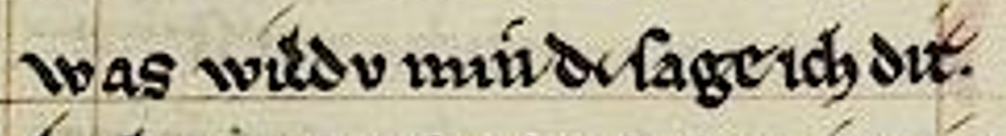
Was wildv min d(az) ſage ich dir.
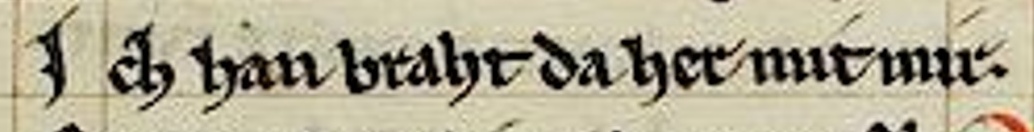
Ich han braht da her mit mir.
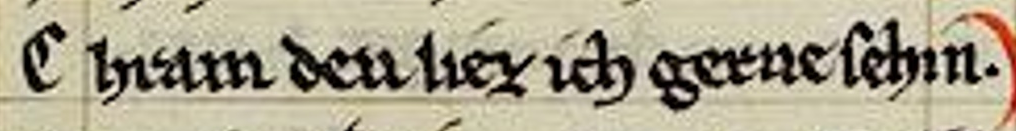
Chram den liez ich gerne ſehin.
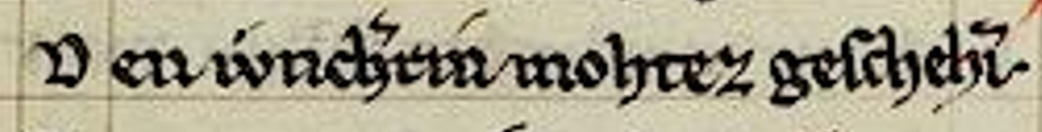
Den ivnch(er)rin mohtez geſchehi(n).
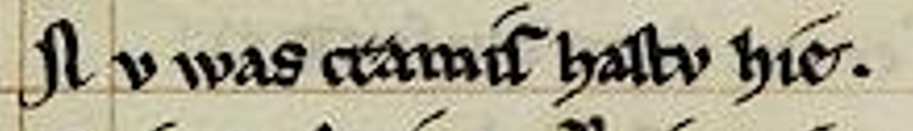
Nv was cramiſ haſtv hie.
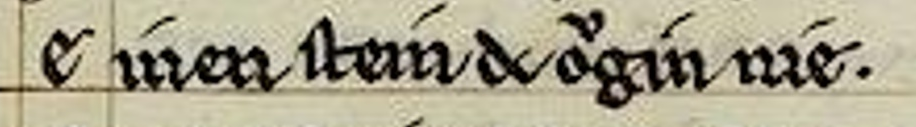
Einen ſtein d(az) o°vgin nie.
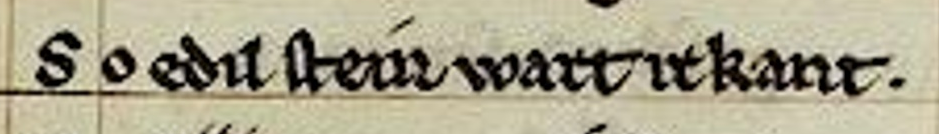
So edil ſtein wart irkant.
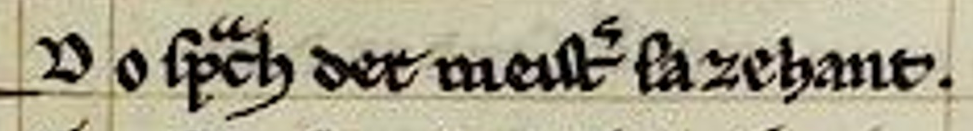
Do ſp(ra)ch der meiſt(er) ſa zehant.
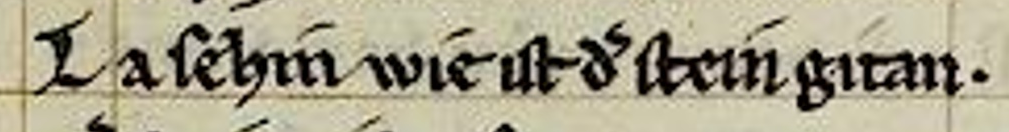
La ſehin wie iſt d(er) ſtein gitan.
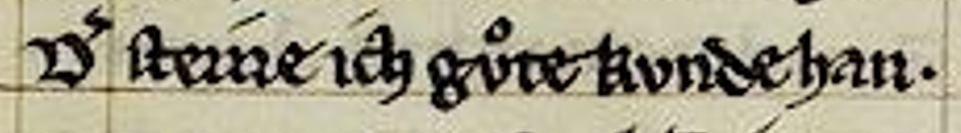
D(er) ſteine ich gv°ote kvnde han.
